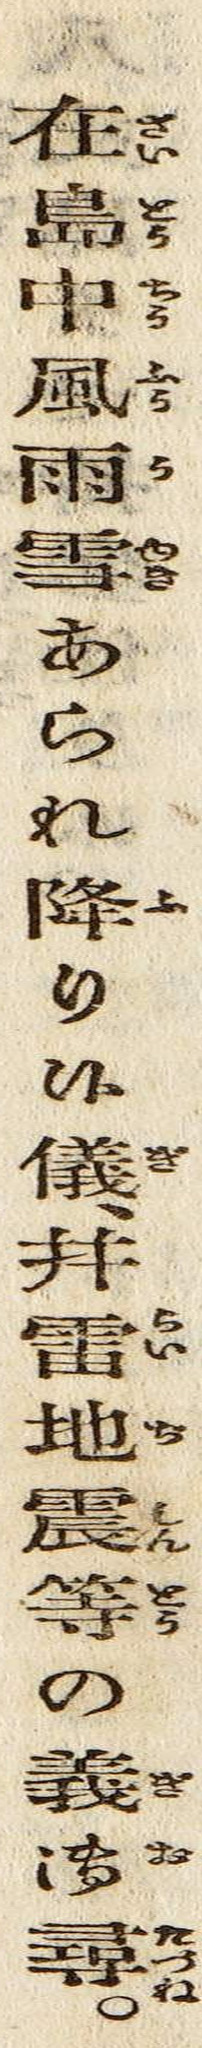在島中風雨雪あられ降り候儀、并雷地震等の義御尋。
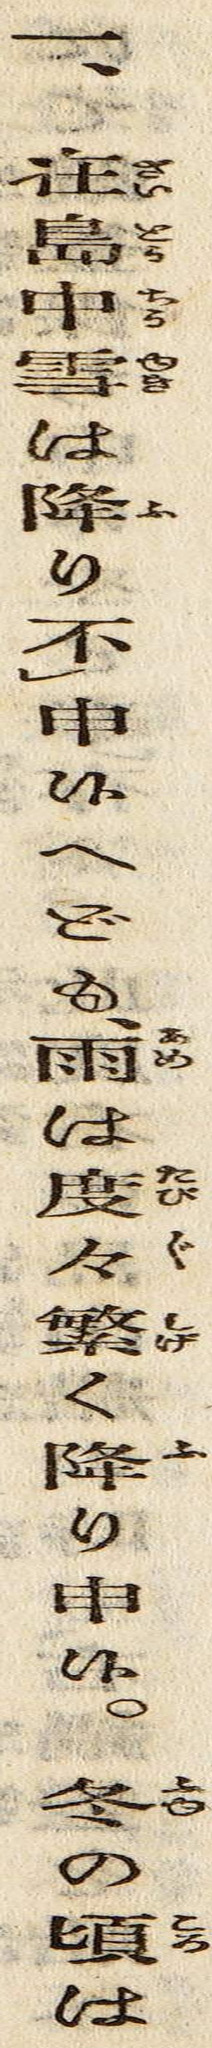一、在島中雪は降り不申候へども、雨は度々繁く降り申候。冬の頃は
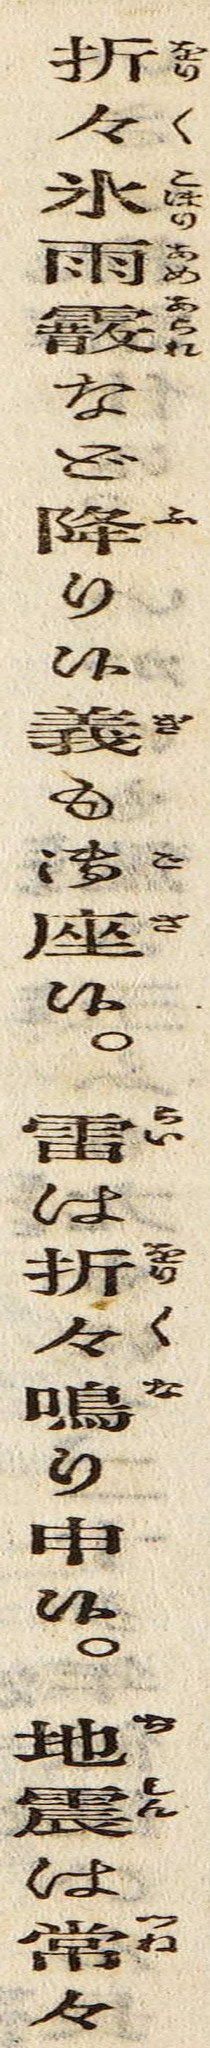折々氷雨霰など降り候義も御座候。雷は折々鳴り申候。地震は常々
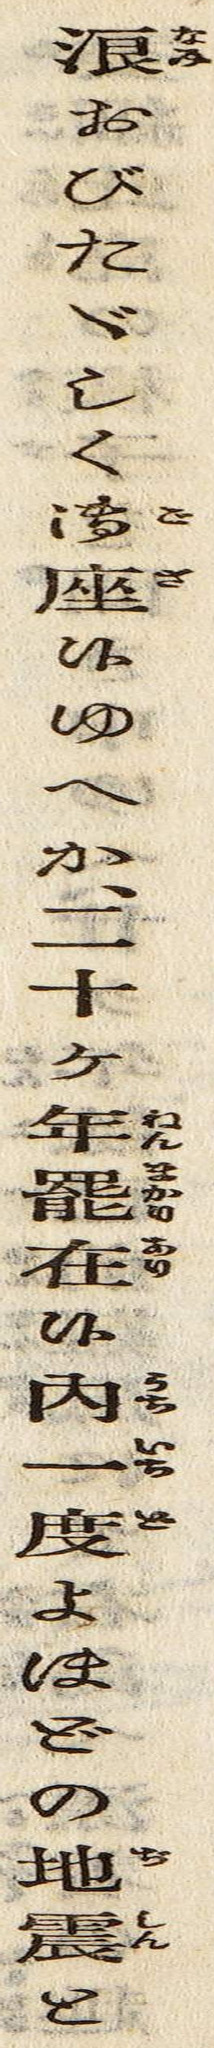浪おびたヾしく御座候ゆへか、二十ケ年罷在候内一度よほどの地震と
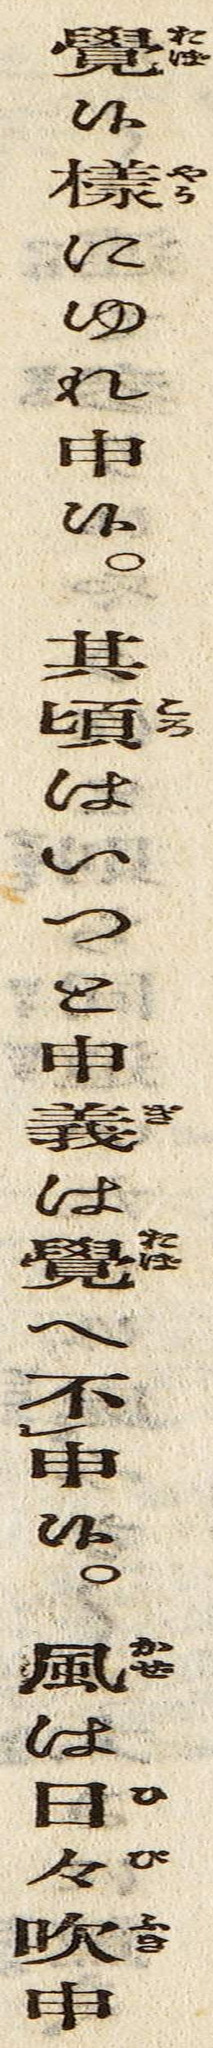覚候様にゆれ申候。其頃はいつと申義は覚へ不申候。風は日々吹申
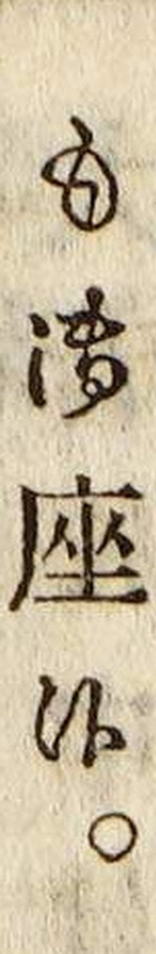も御座候。
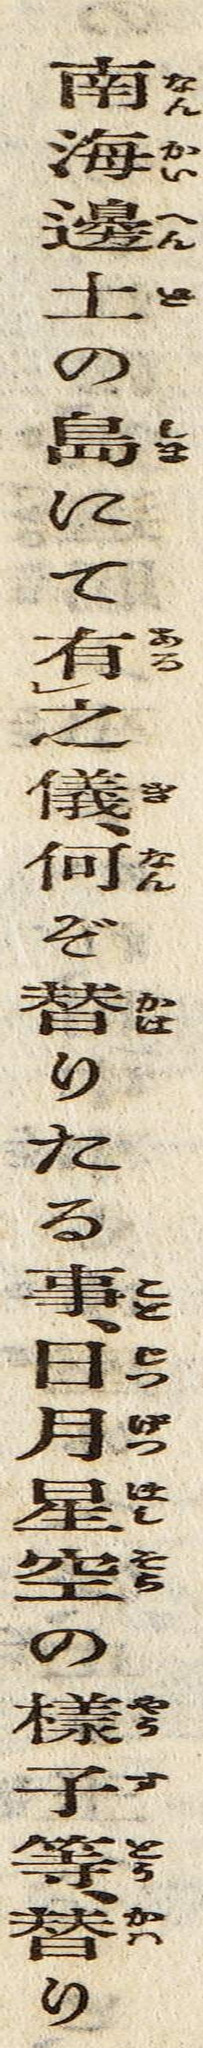南海辺土の島にて有之儀、何ぞ替りたる事、日月星空の様子等、替り
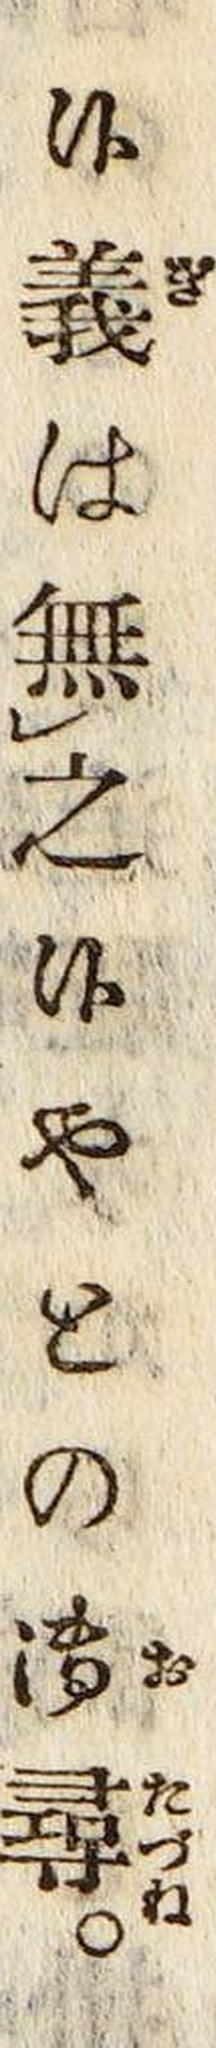候義は無之候やとの御尋。
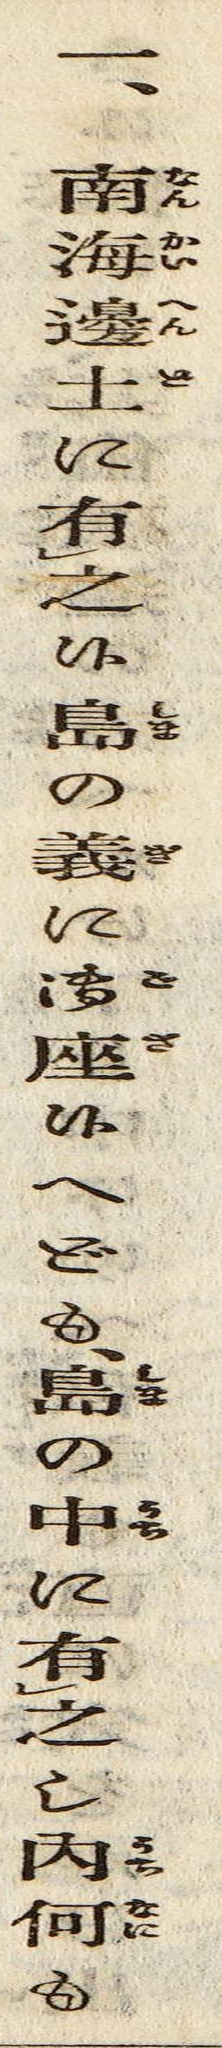一、南海辺土に有之候島の義に御座候へども、島の中に有之し内何も
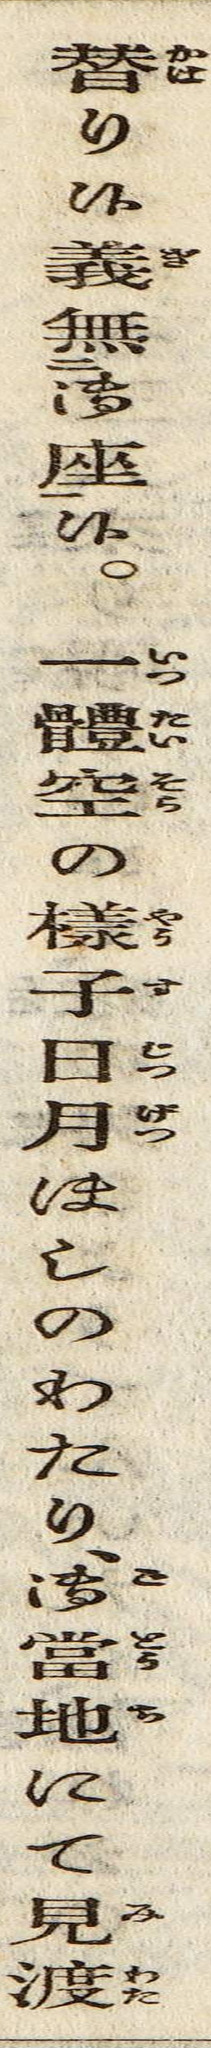替り候義無御座候。一体空の様子日月ほしのわたり、御当地にて見渡
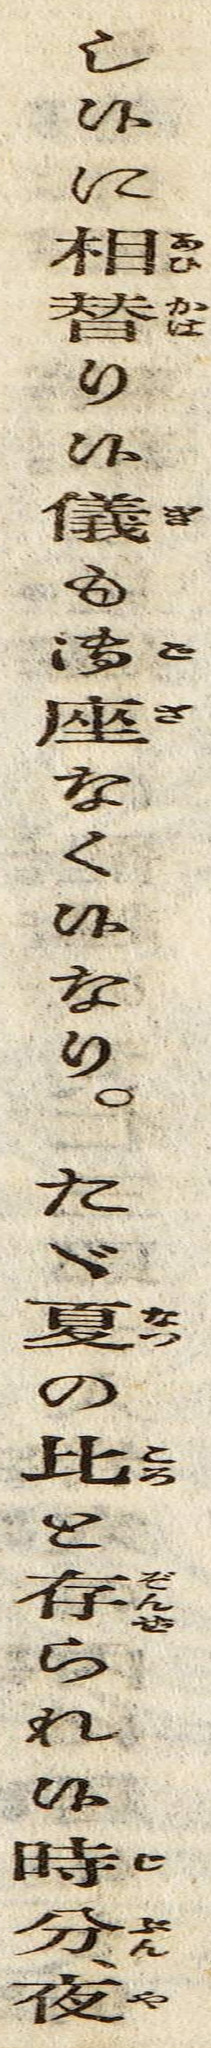し候に相替り候儀も御座なく候なり。たヾ夏の比と存られ候時分、夜
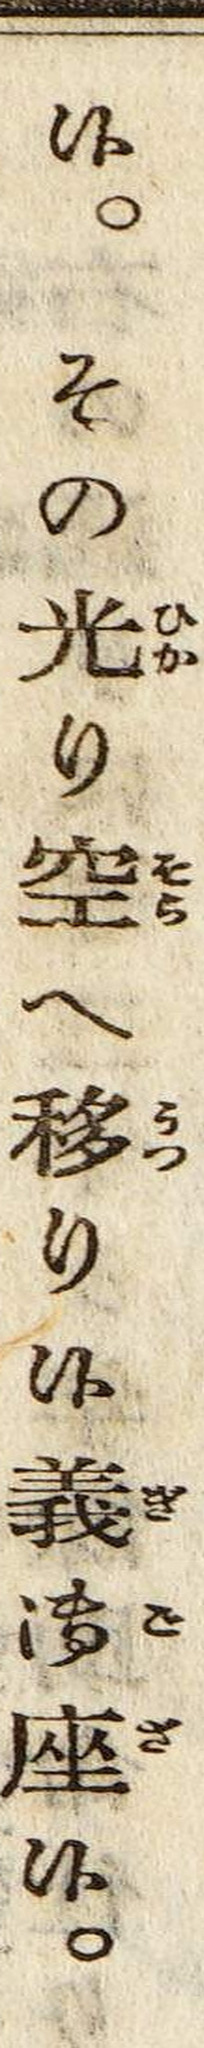候。その光り空へ移り候義御座候。

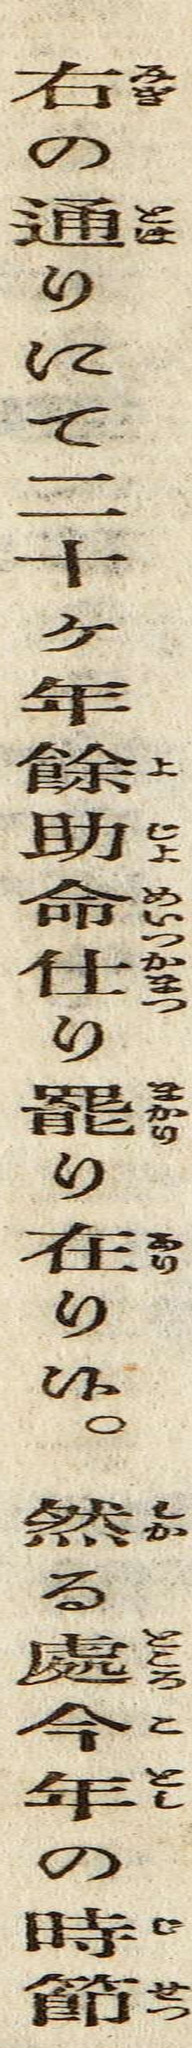右の通りにて二十ケ年余助命仕り罷り在候。然る処今年の時節
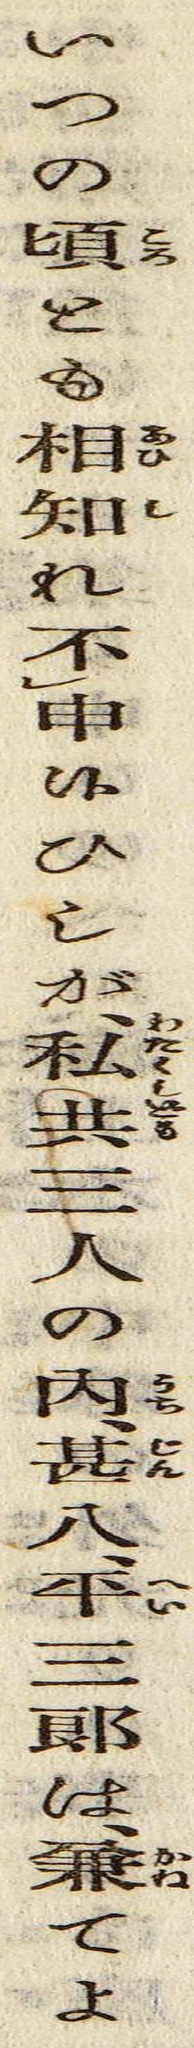いつの頃とも相知れ不申候ひしが、私共三人の内、甚八、平三郎は、兼てよ
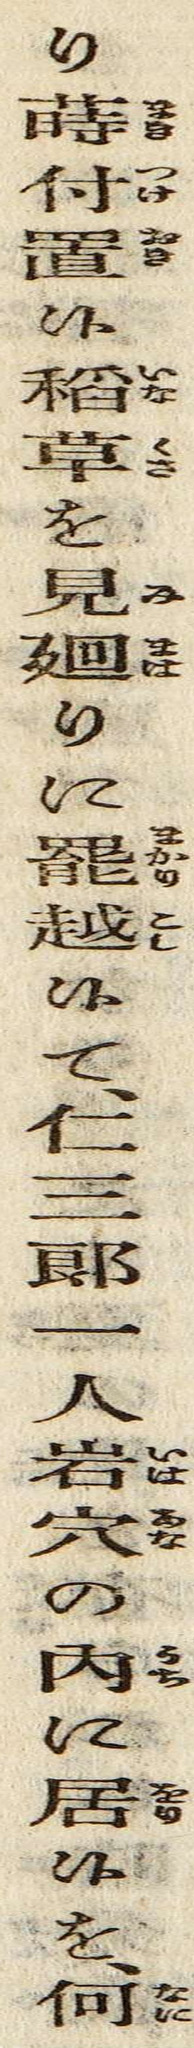り蒔付置候稲草を見廻りに罷越候て、仁三郎一人岩穴の内に居候を、何
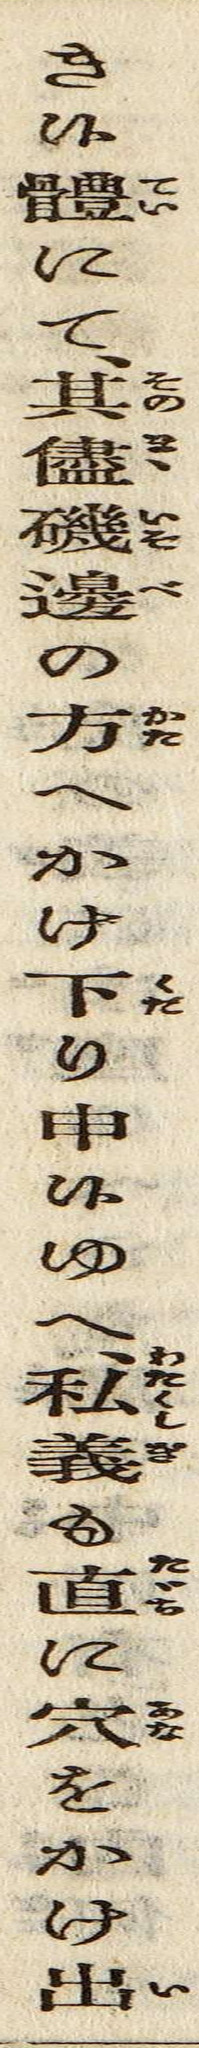き候体にて、其儘磯辺の方へかけ下り申候ゆへ、私義も直に穴をかけ出
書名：日本漂流譚
